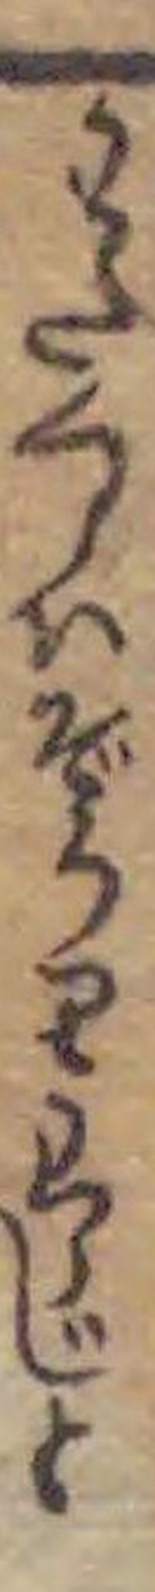わたくしはぞうりわらじと
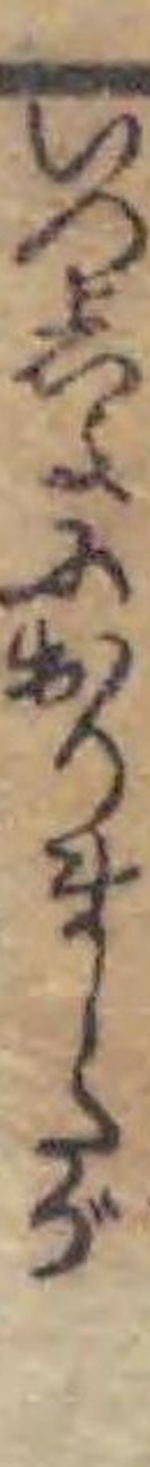いつしよにおりましたが
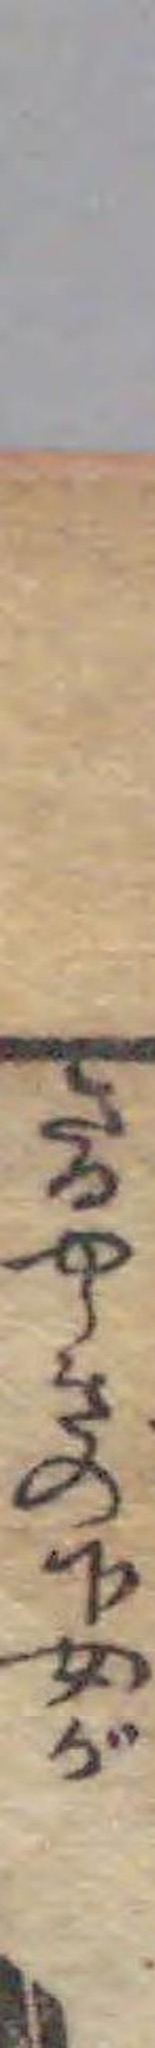さるやしきの下女が
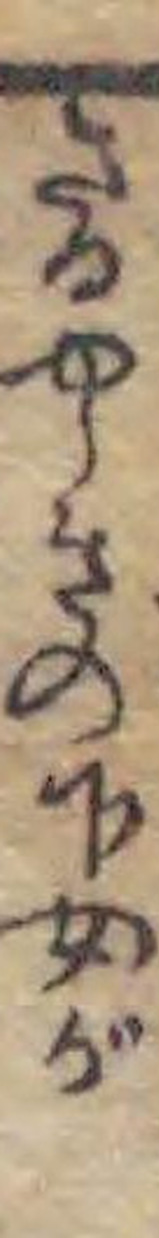さるやしきの下女が
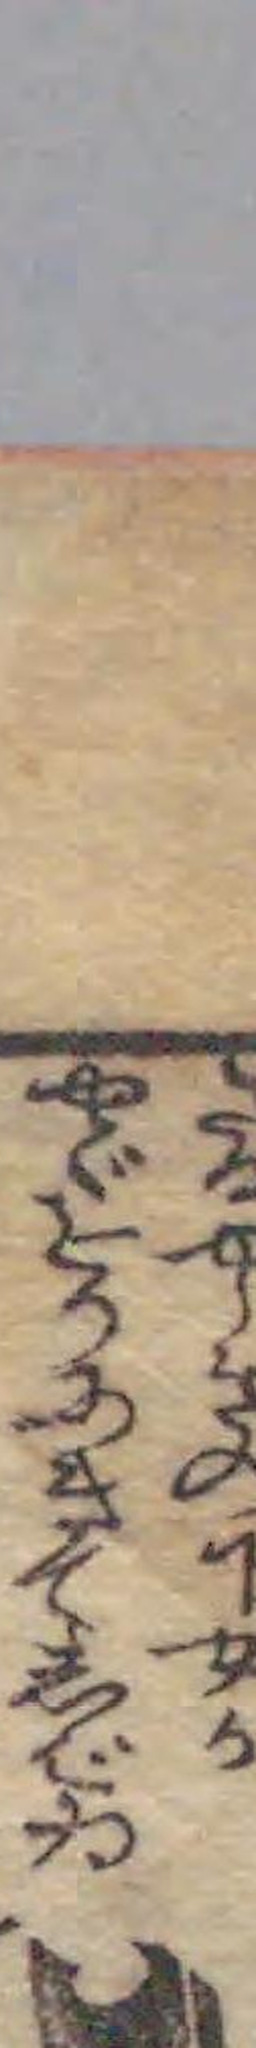やどをりにきてしばゐ
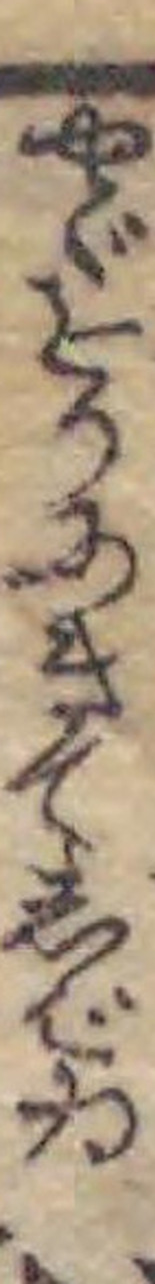やどをりにきてしばゐ
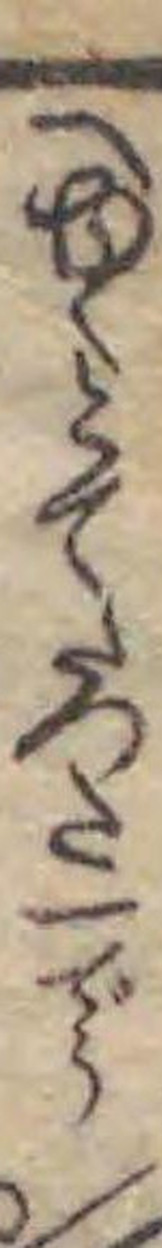へゆくとてたつた一でう
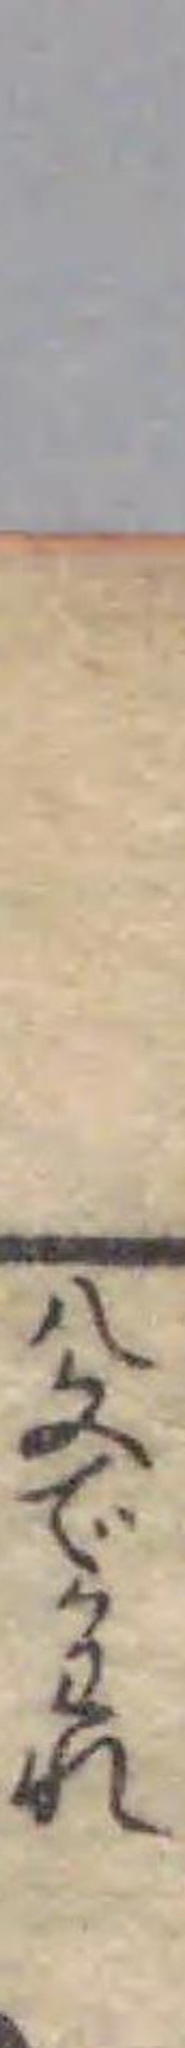八文でかわれ
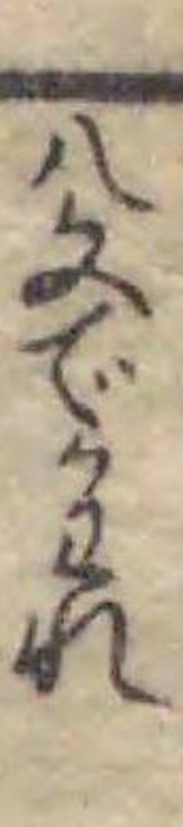八文でかわれ
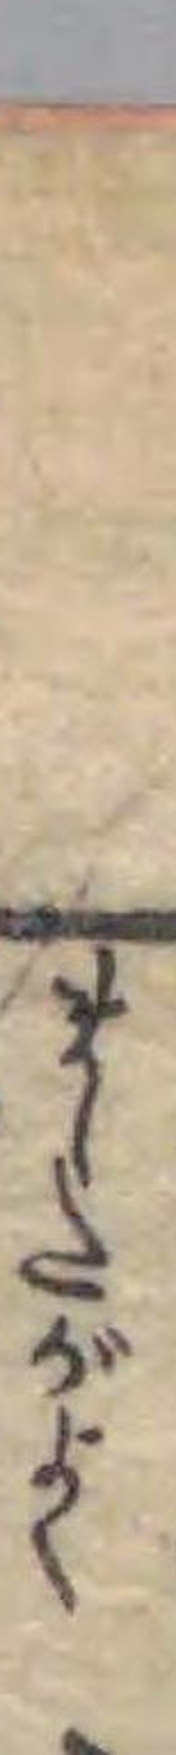ましたがよく
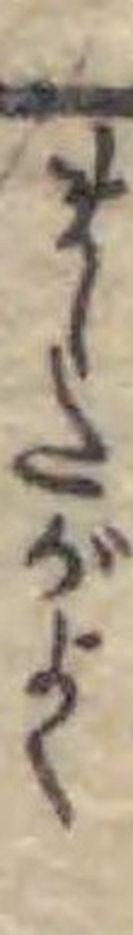ましたがよく
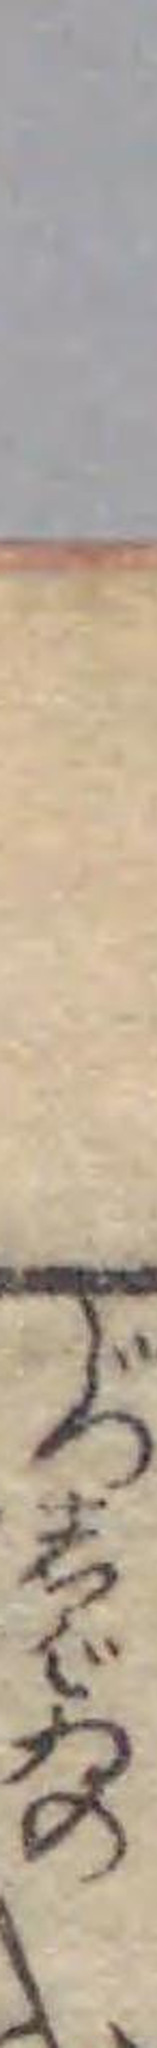じつしばゐの
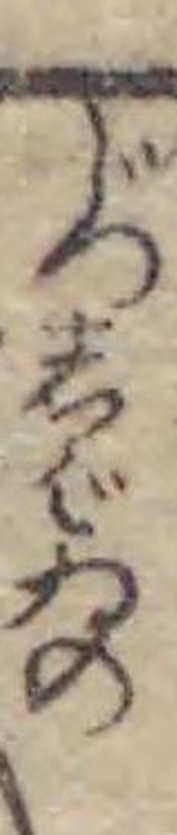じつしばゐの
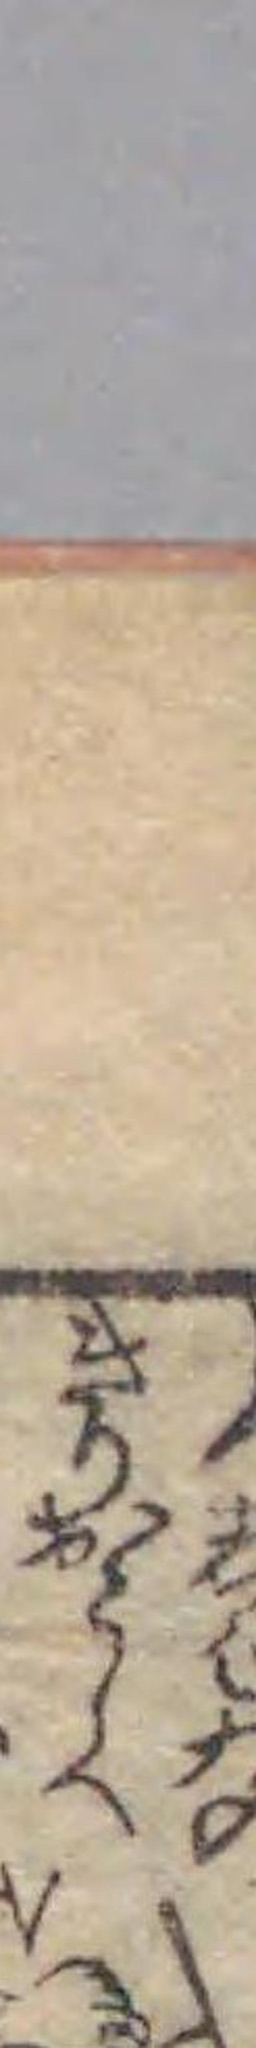きりおとしへ
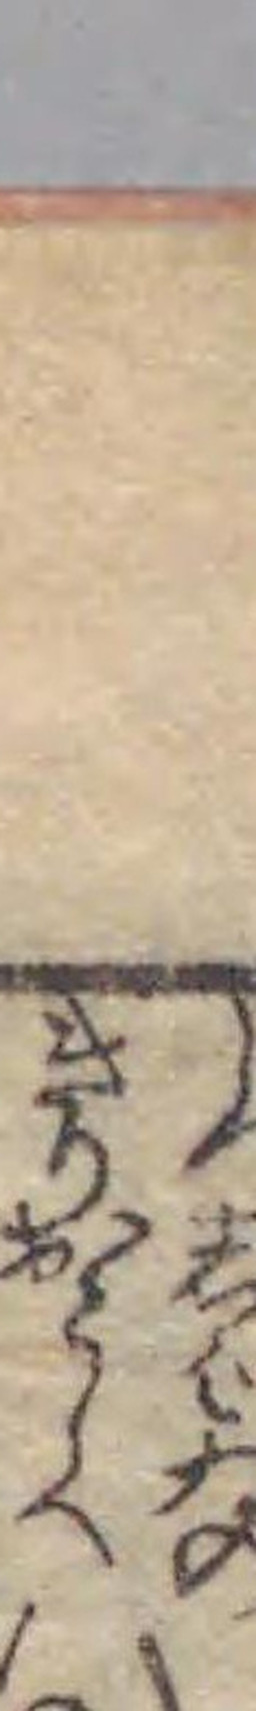きりおとしへ
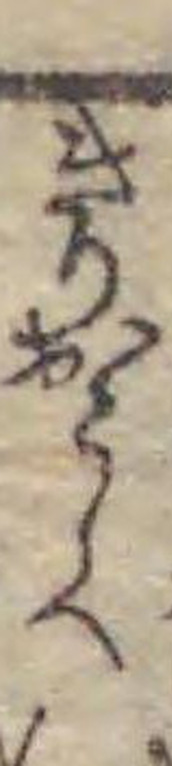きりおとしへ
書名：紙屑身上噺 : 3巻
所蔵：国立国会図書館 National Diet Library, JAPAN
